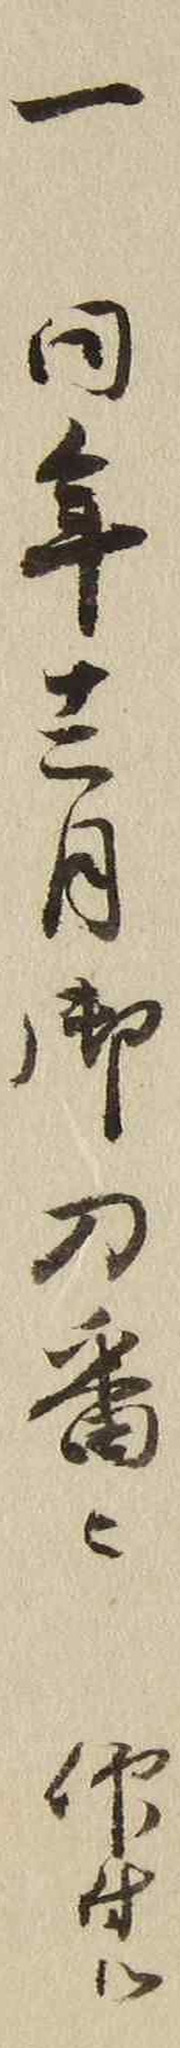一同年十二月御刀番被仰付候
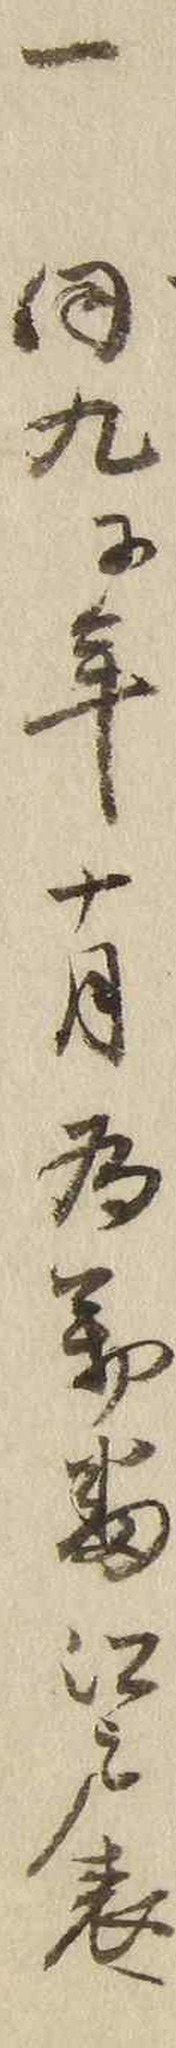一同九子年十月為勤番江戸表へ

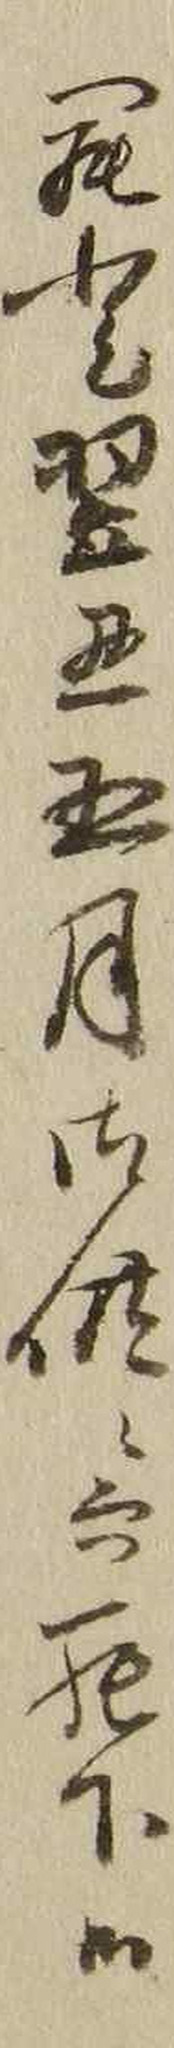罷登翌丑五月御供ニ而罷下候
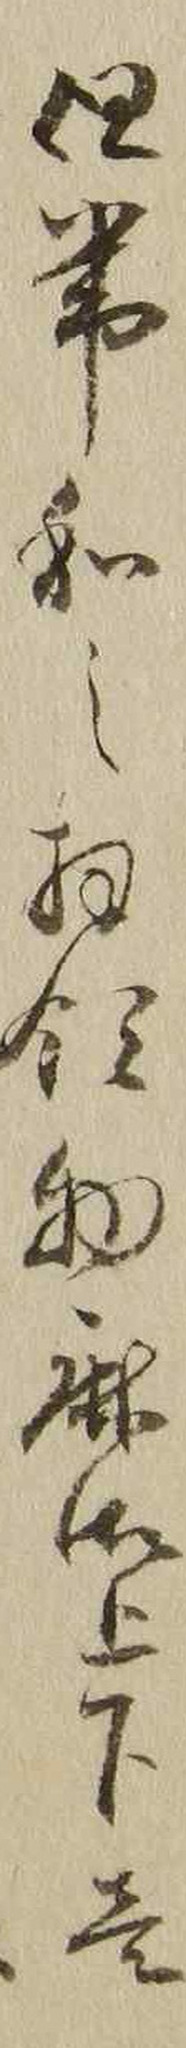但常和之拝領物麻御上下壱
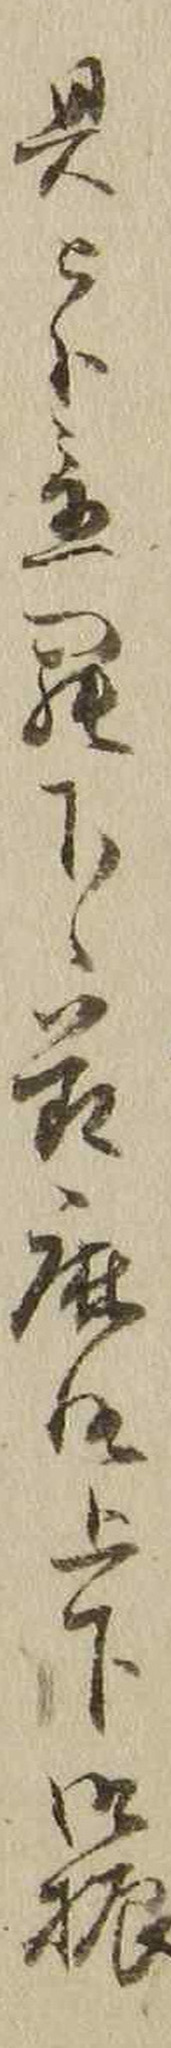具被下置罷下候節麻御上下御振
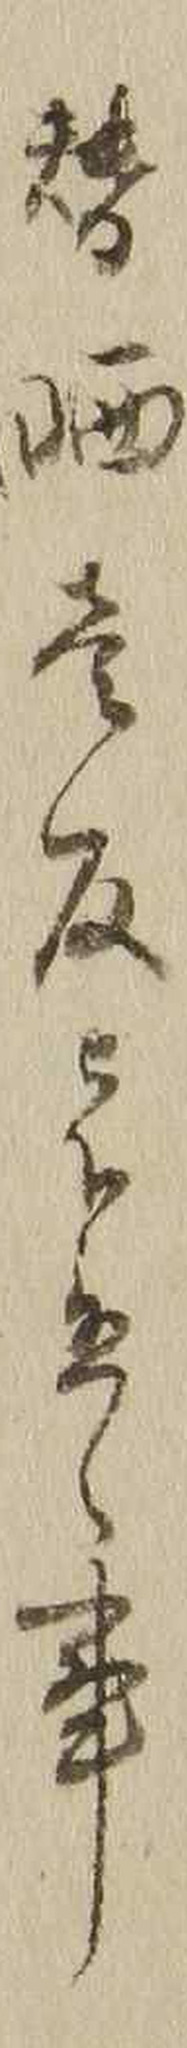替晒壱反被下置候事
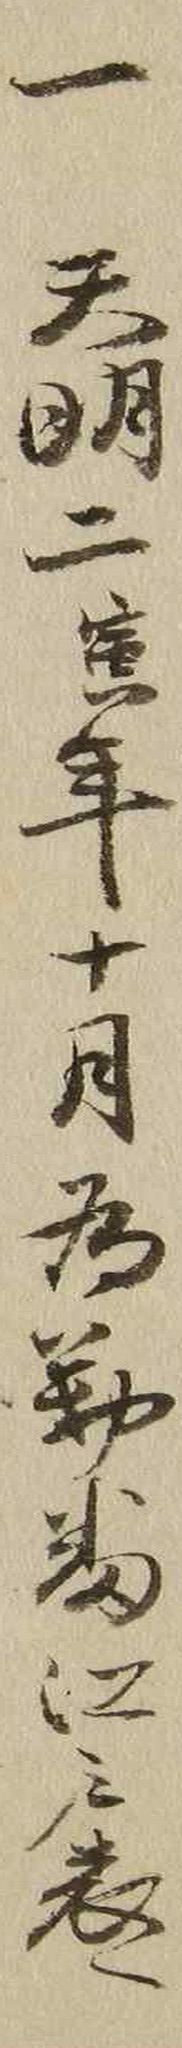一天明二寅年十月為勤番江戸表へ
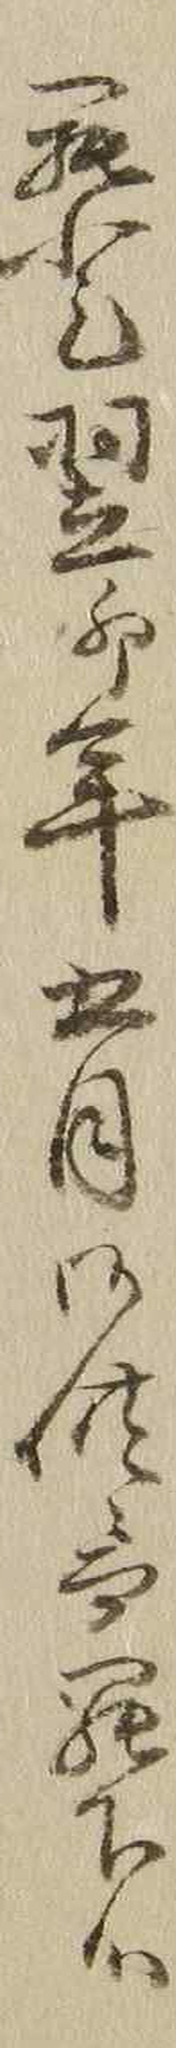罷登翌卯年五月御供ニ而罷下候
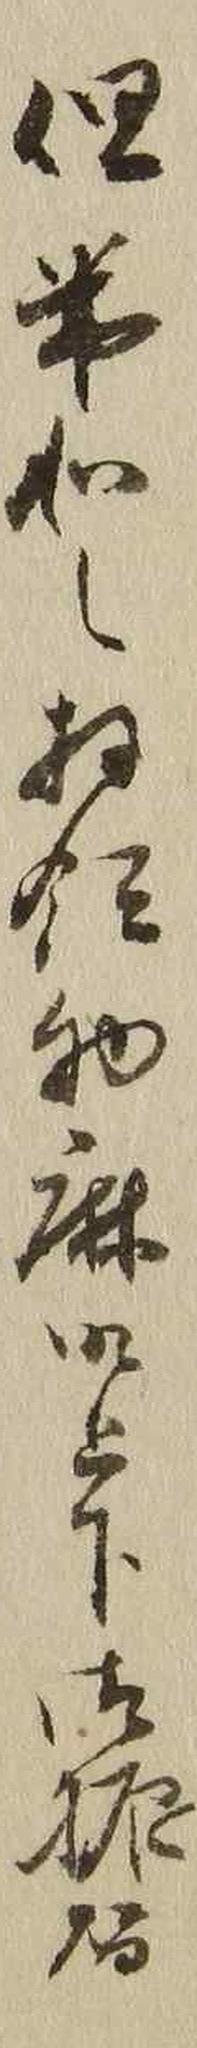但常和之拝領物麻御上下御振替
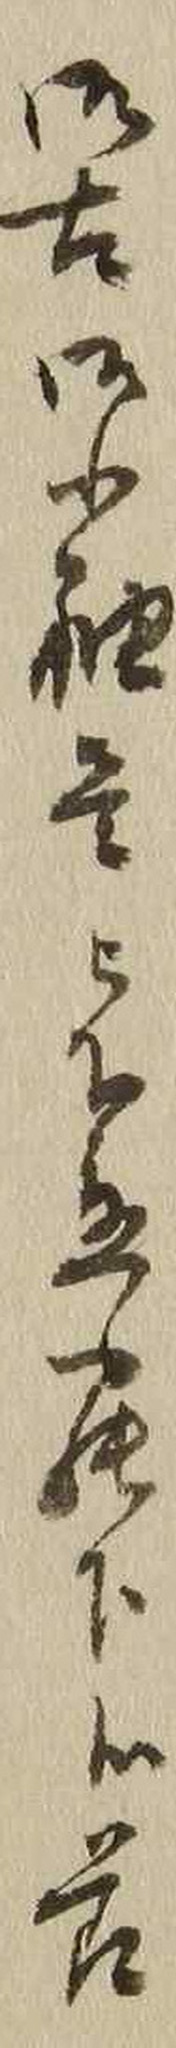御古御小袖壱被下置罷下候節
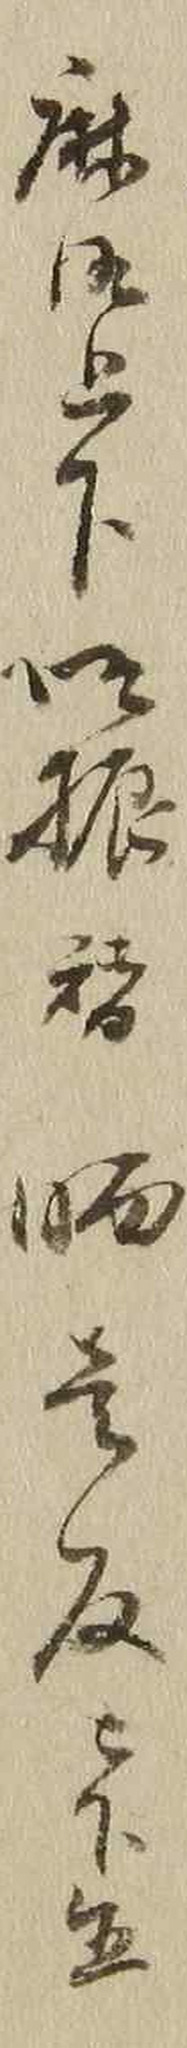麻御上下御振替晒壱反被下置
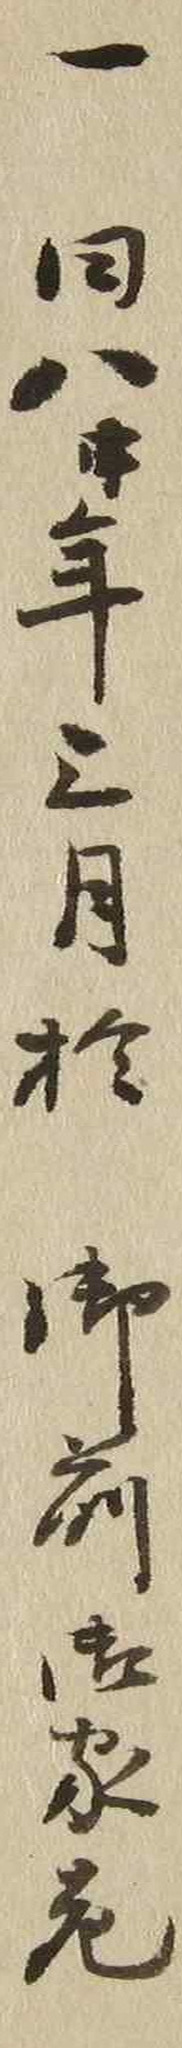一同八申年三月於御前御家老
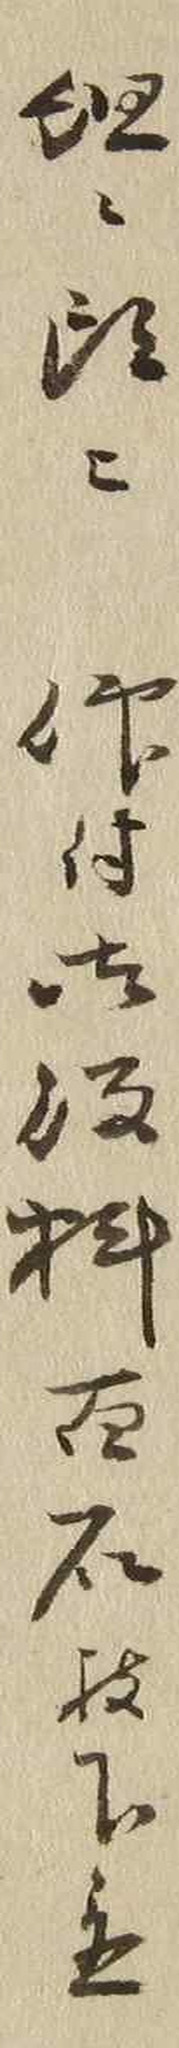組々頭被仰付御役料百石被下置
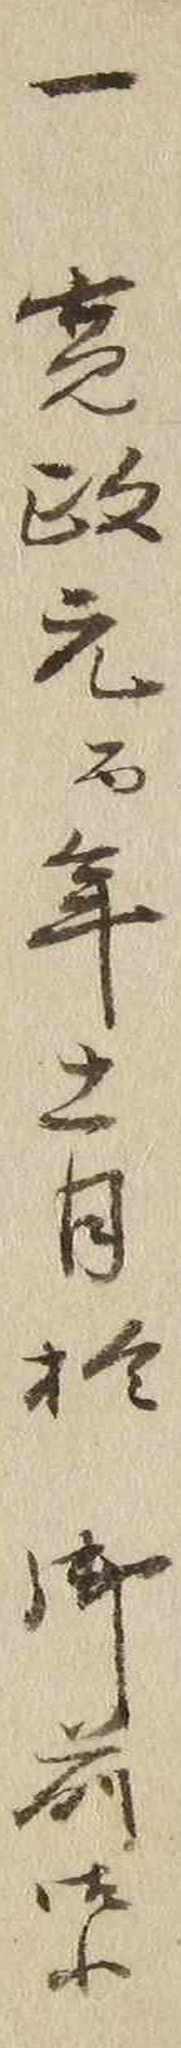一寛政元酉年十一月於御前御小
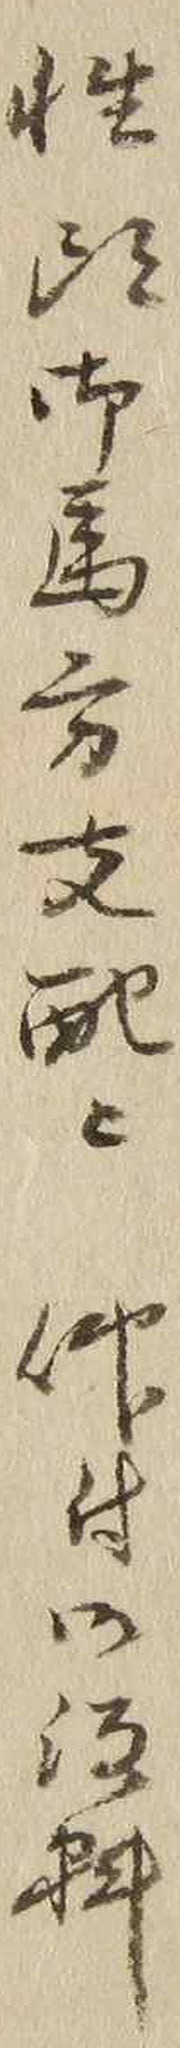性頭御馬方支配被仰付御役料
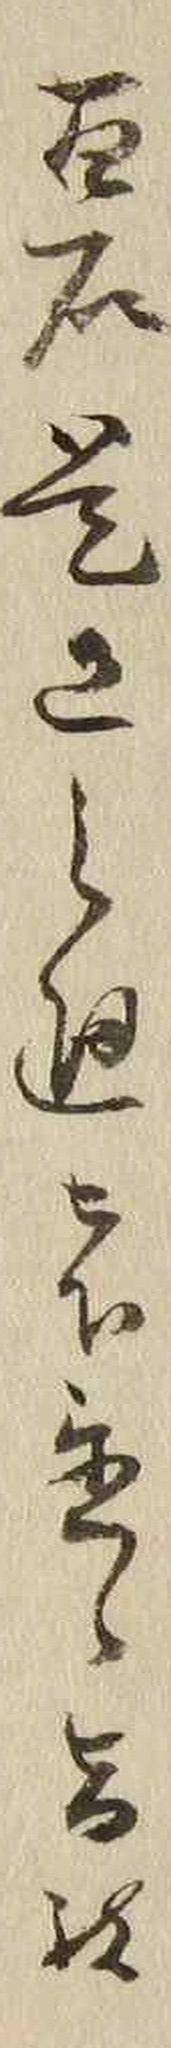百石是迄之通被下置候旨被
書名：諸士系譜　巻之225　ま之部6
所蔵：会津若松市立会津図書館
